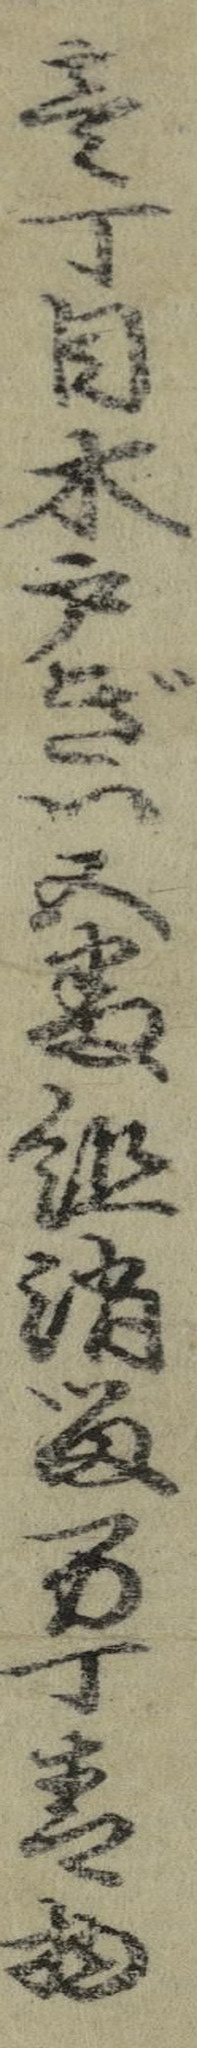丁目木戸ぎハ五番組消留万丁青物
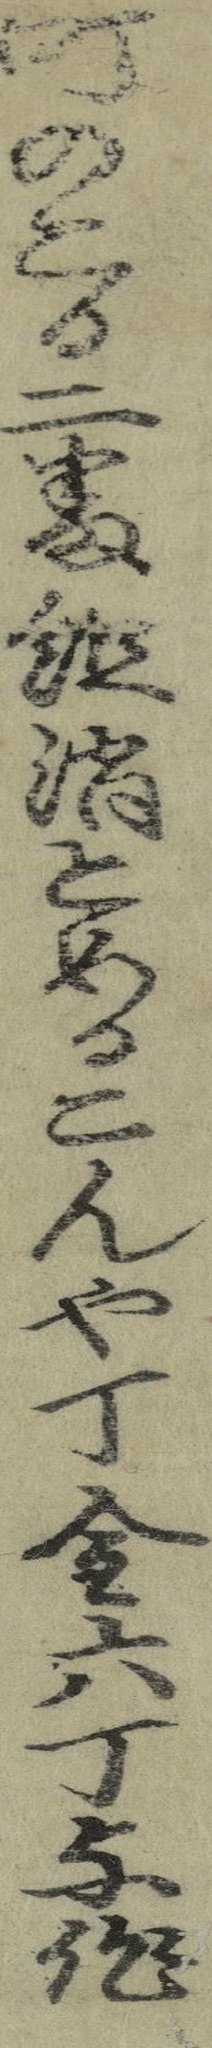町のこる二番組消とめるこんや丁金六丁与作
